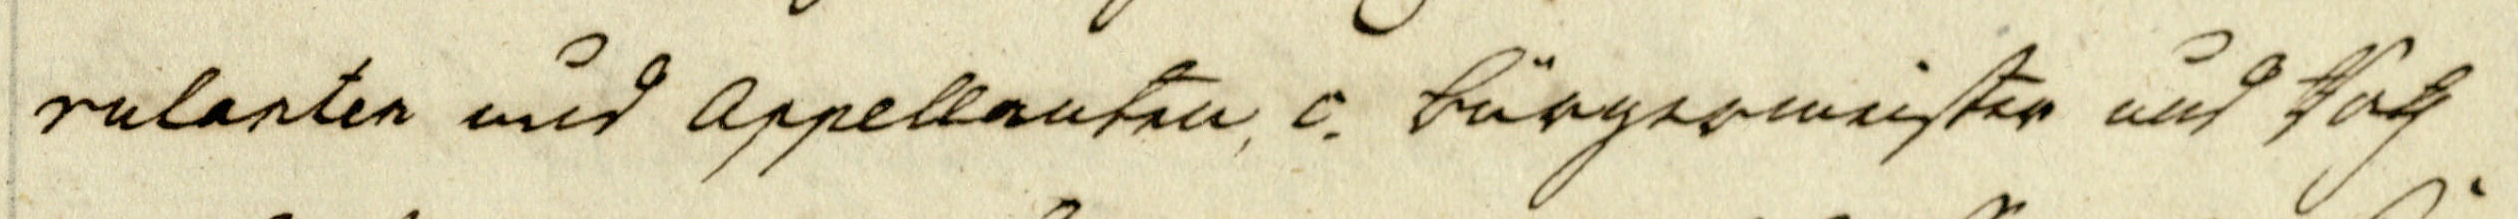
rulanten und Appellanten c. Bürgermeister und Rath
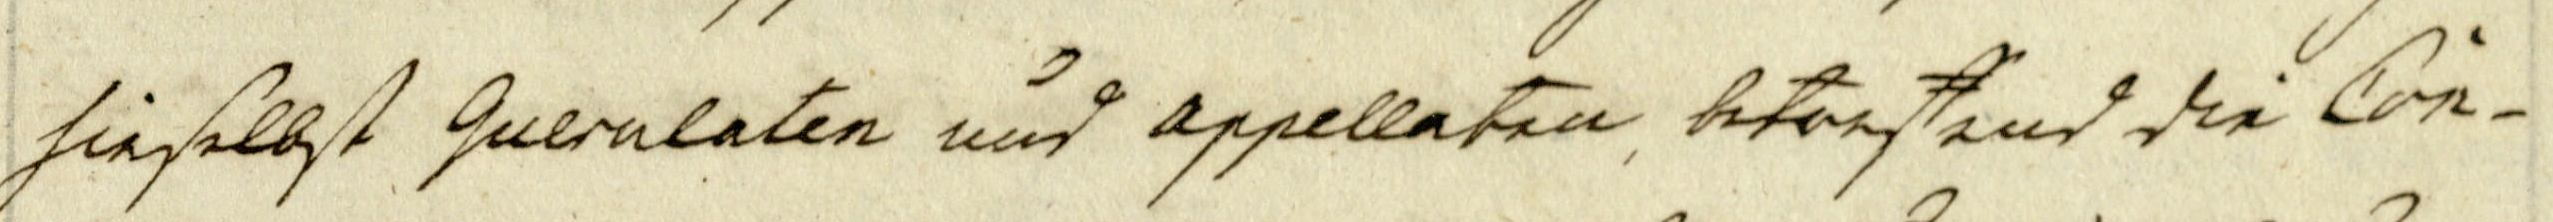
hieselbst Querulaten und Appellaten, betreffend die Con¬
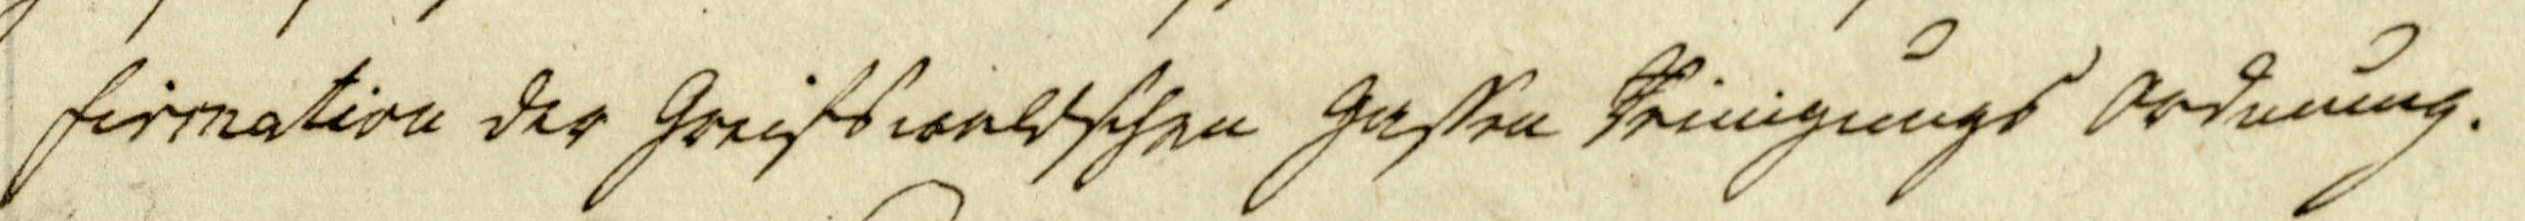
firmation der Greifswaldschen Gassen Reinigungs Ordnung.
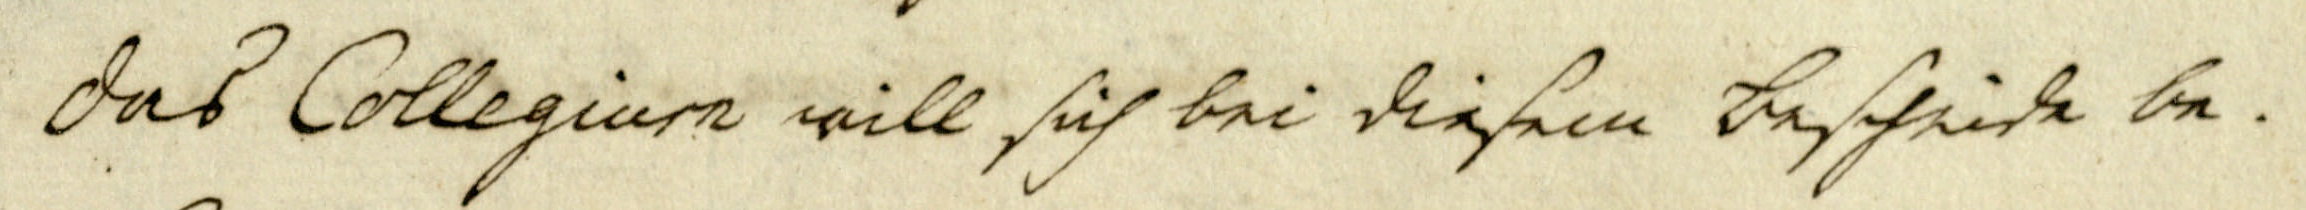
Das Collegium will sich bei diesem Bescheide be¬
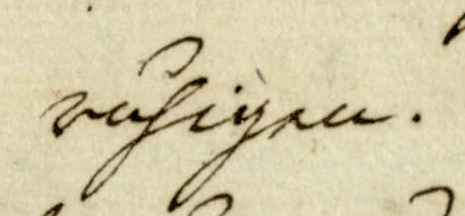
ruhigen.
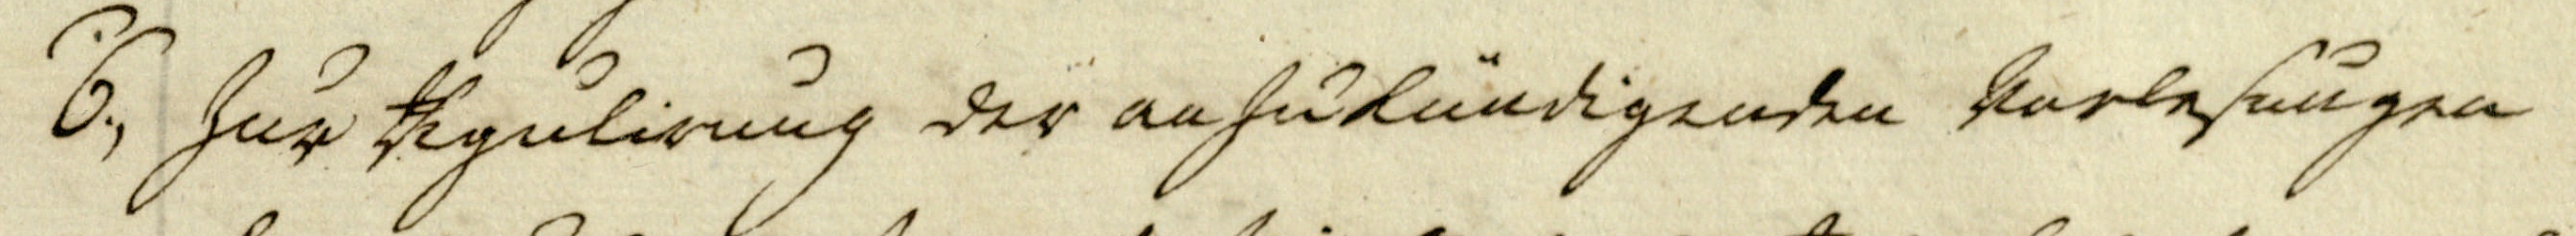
6., Zur Regulirung der anzukündigenden Vorlesungen
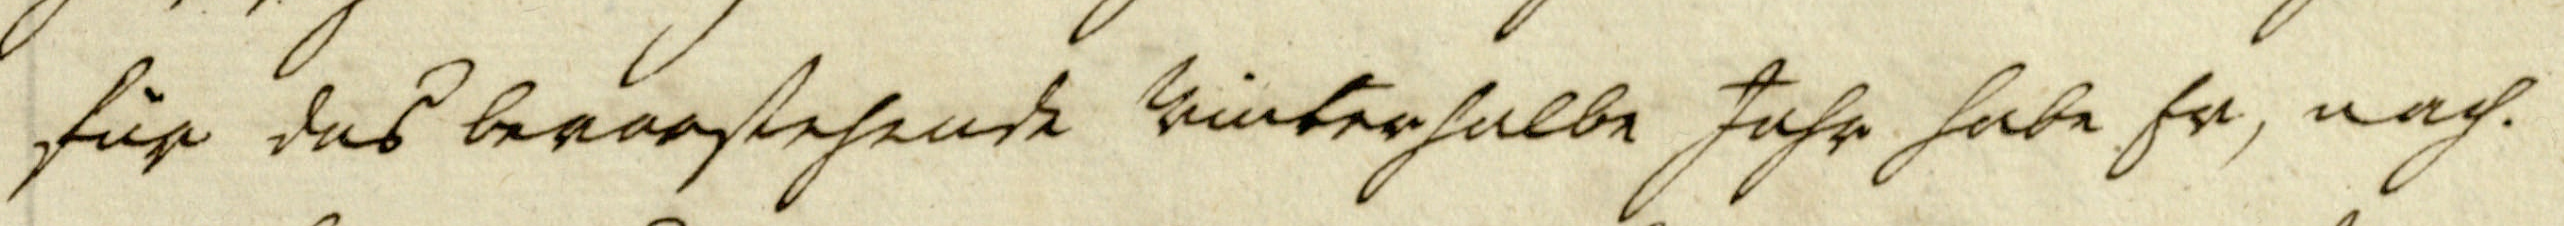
für das bevorstehende Winterhalbe Jahr habe Er, nach¬
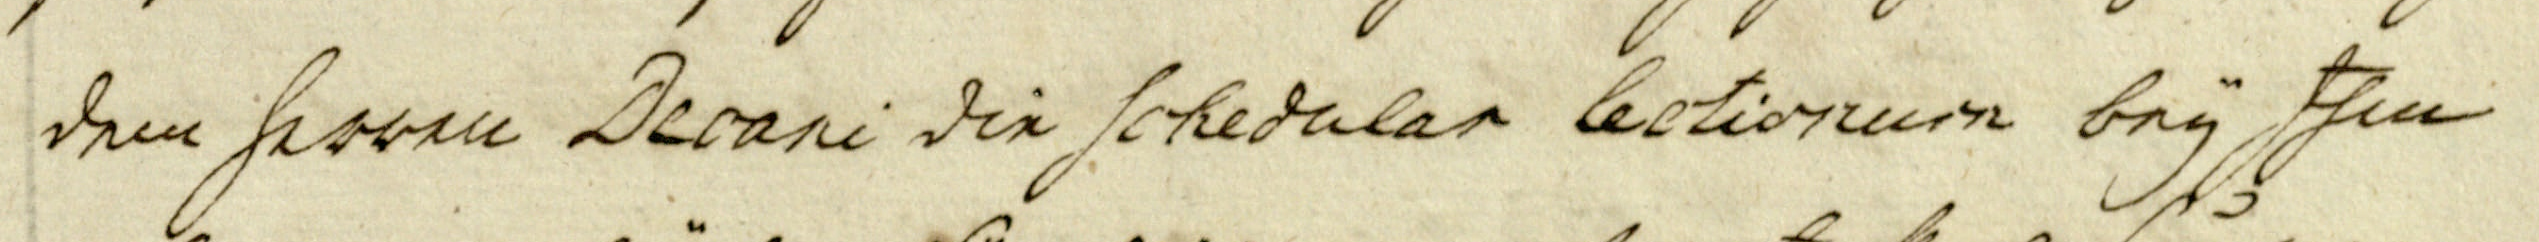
dem herren Decani die schedular lectionum beÿ Ihm
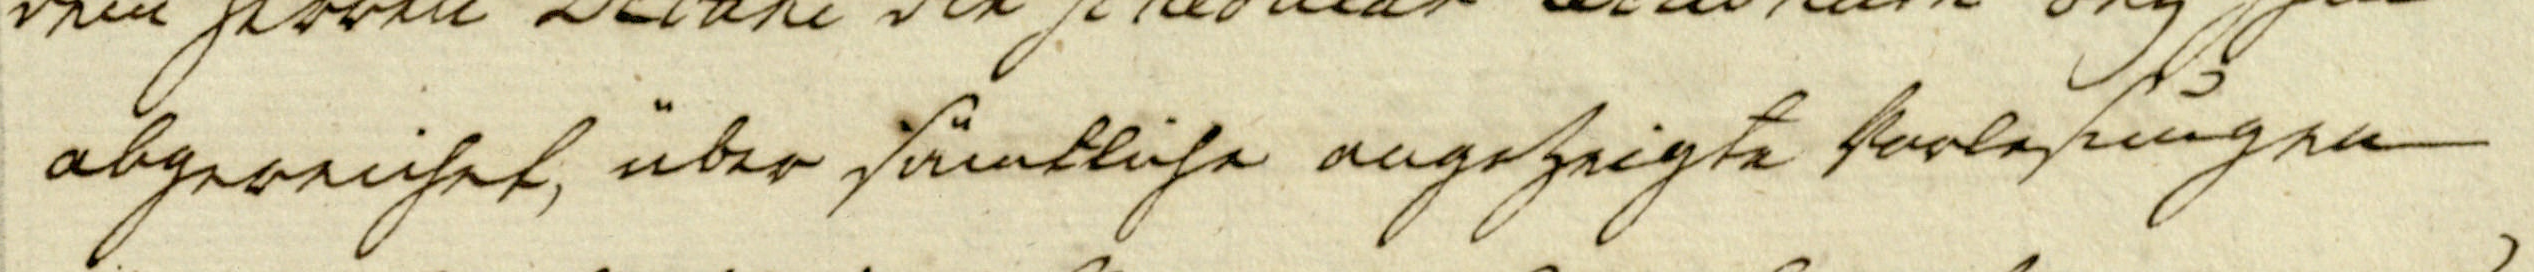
abgereichet, über sämtliche angezeigte Vorlesungen
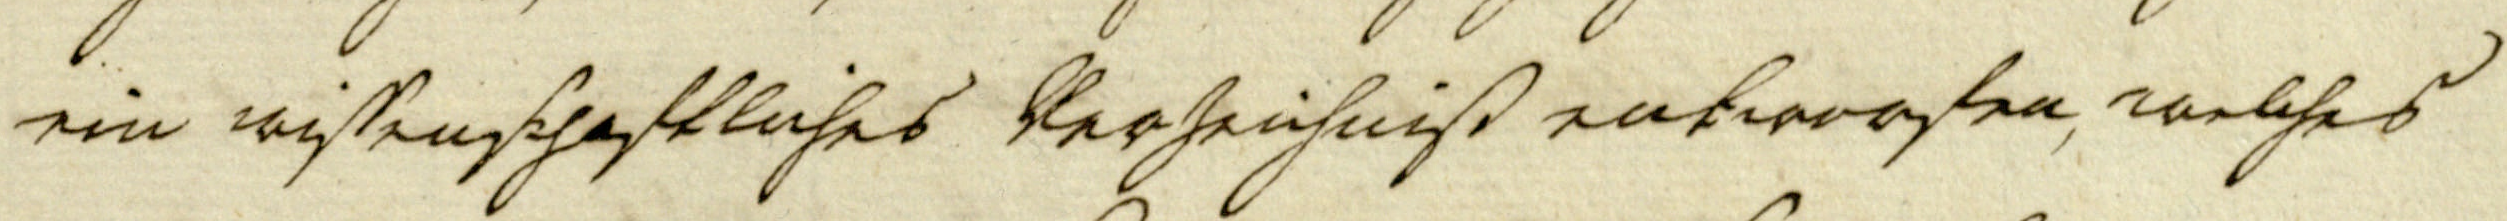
ein wissenschaftliches Verzeichniß entworfen, welches
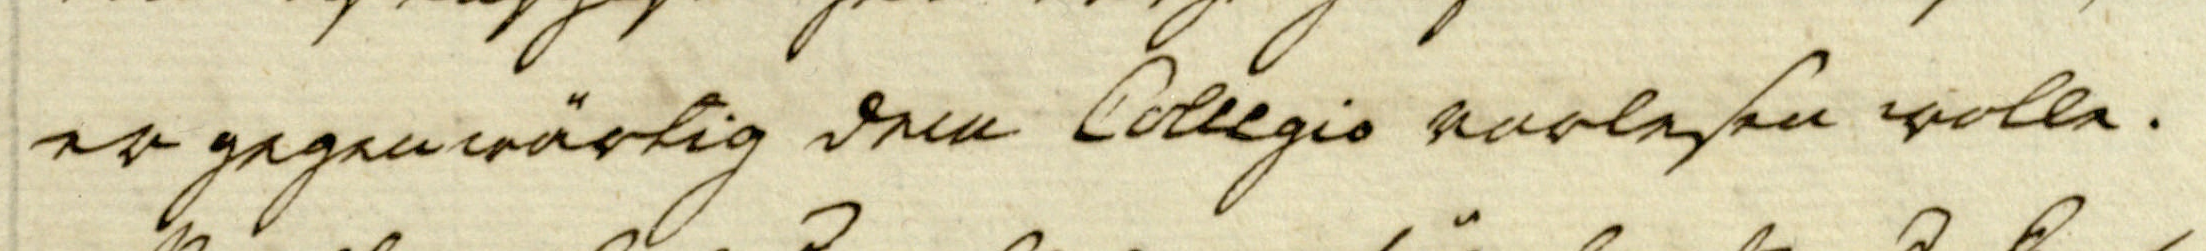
er gegenwärtig dem Collegio vorlesen wolle.
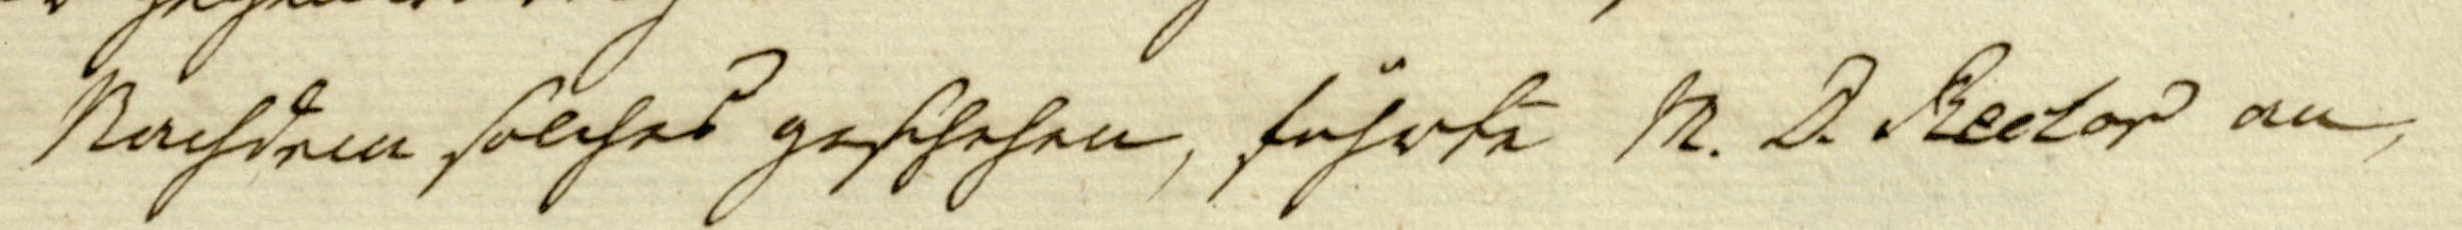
Nachdem solches geschehen, führte M. D. Rector an
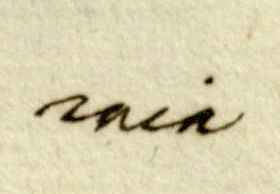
wie
